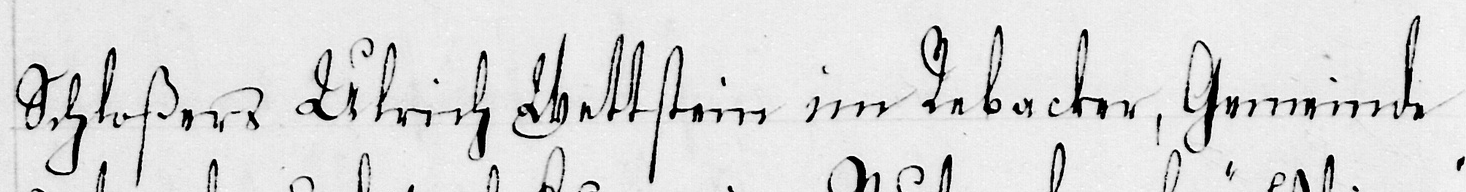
Schloßers Ulrich Wettstein im Rebacker, Gemeinde
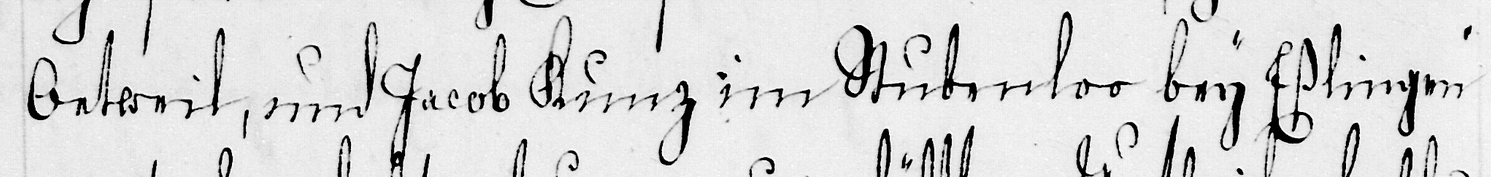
Oetweil, und Jacob Kunz im Stubenloo bey Eßlingen
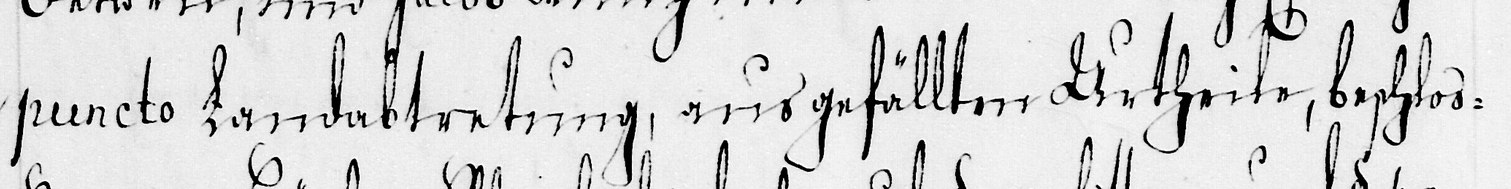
puncto Landabtretung, ausgefällten Urtheile, beschlo¬
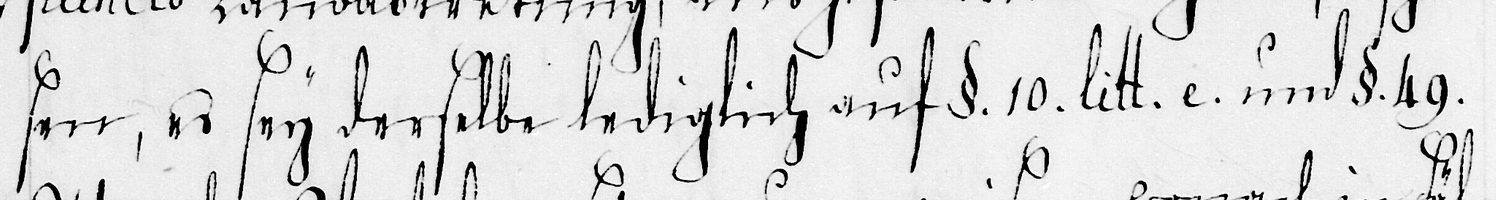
ßen, es sey derselbe lediglich auf §. 10. litt. e.
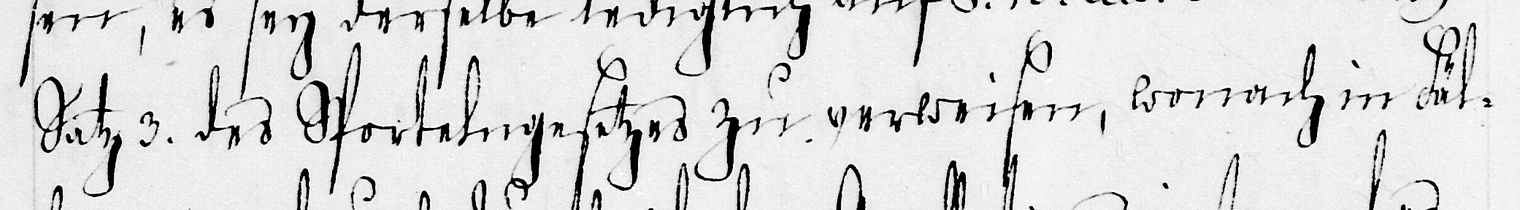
Satz 3. des Sportelngesetzes zu verweisen, wonach in Fäl¬
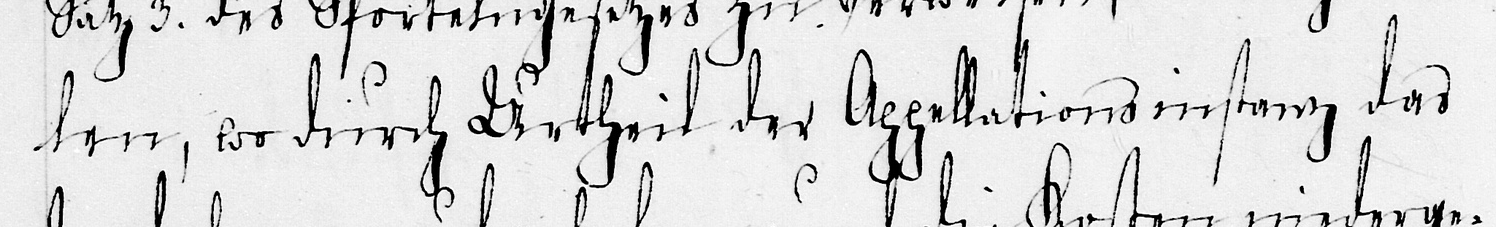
len, wo durch Urtheil der Appellationsinstanz das
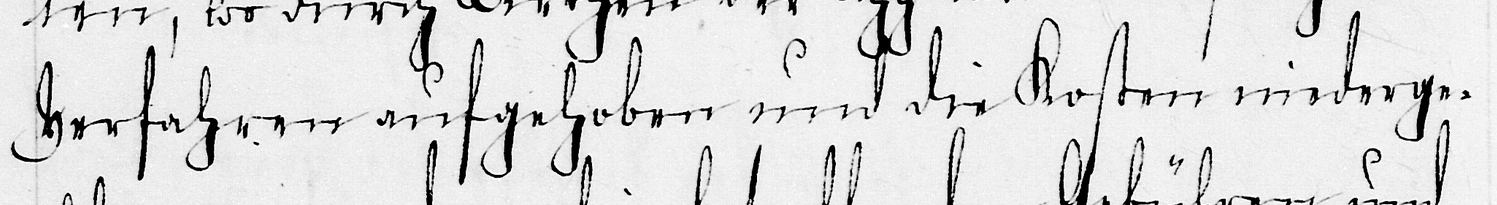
Verfahren aufgehoben und die Kosten niederge¬
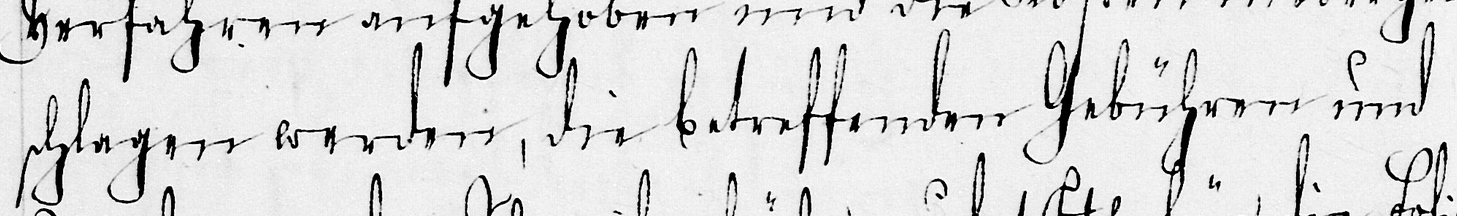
schlagen werden, die betreffenden Gebühren und
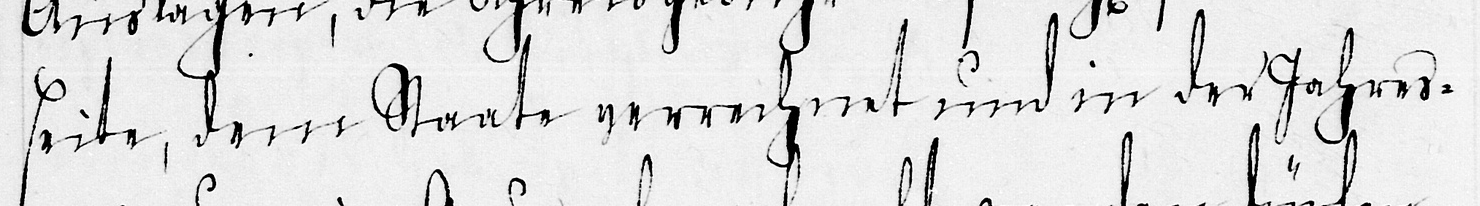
seite, dem Staate verrechnet und in der Jahres¬
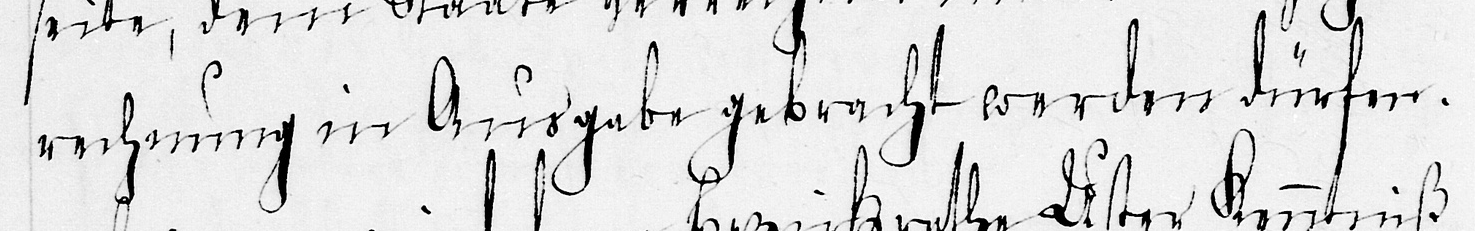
rechnung in Ausgabe gebracht werden dürfen.
